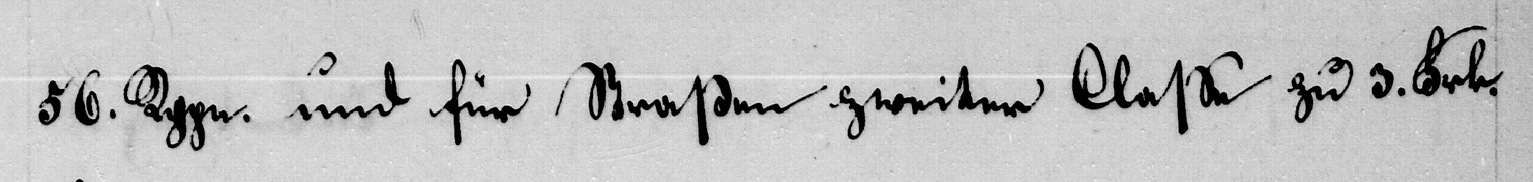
56. Rppn. und für Straßen zweiter Claße zu 3. Frk.
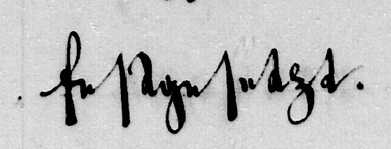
festgesetzt.
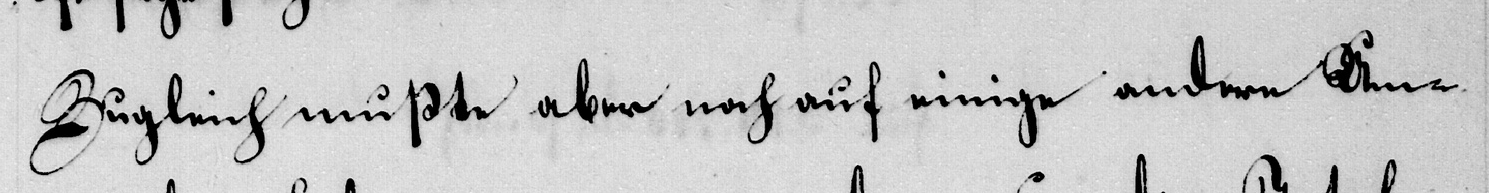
Zugleich mußte aber noch auf einige andere Um¬
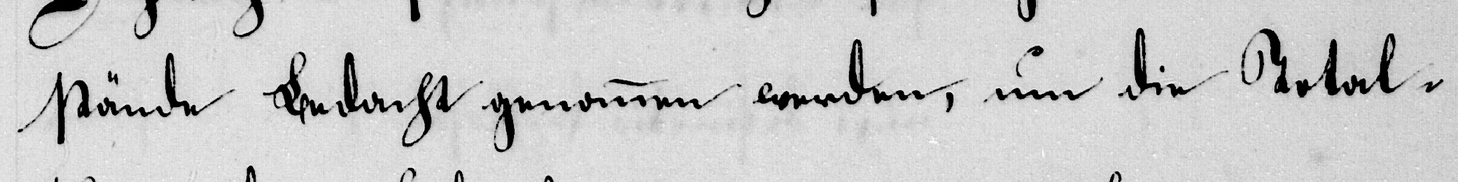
stände Bedacht genommen werden, um die Total¬
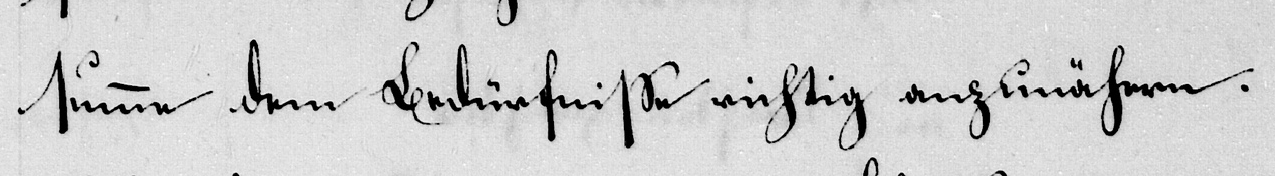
summe dem Bedürfniße richtig anzunähern.
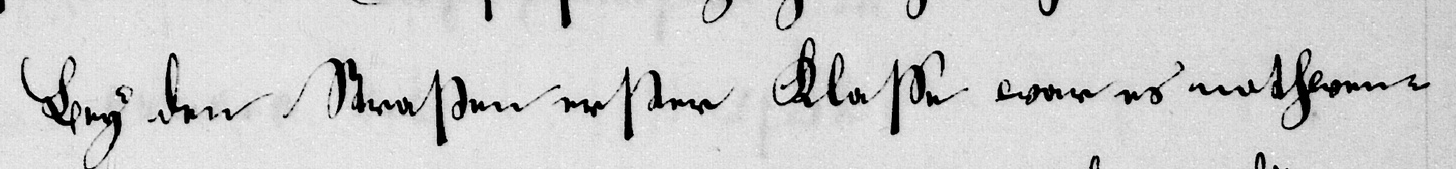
Bey den Straßen erster Klaße war es nothwen¬
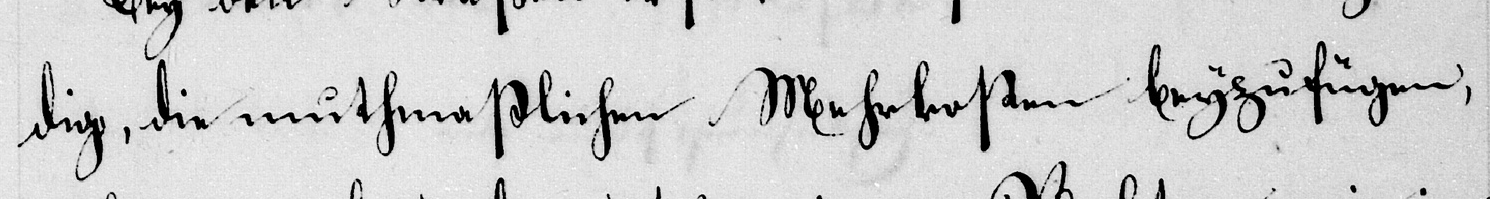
dig, die muthmaßlichen Mehrkosten beyzufügen,
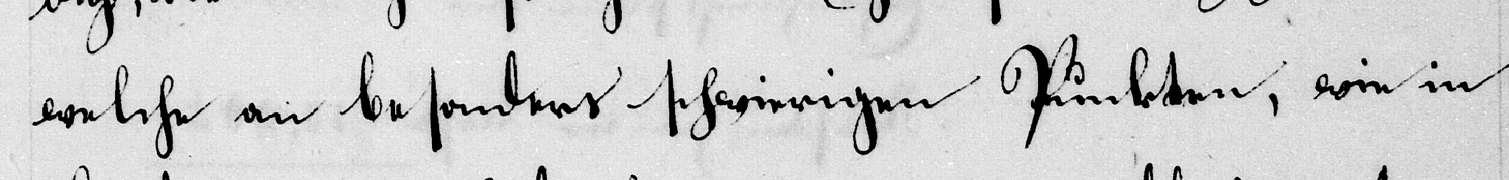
welche an besonders schwierigen Punkten, wie in
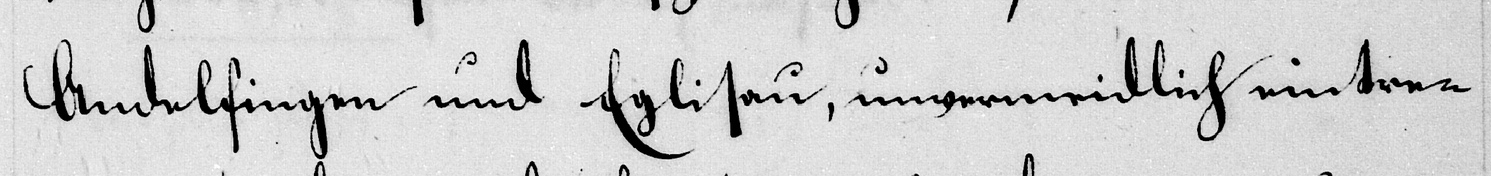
Andelfingen und Eglisau, unvermeidlich eintre¬
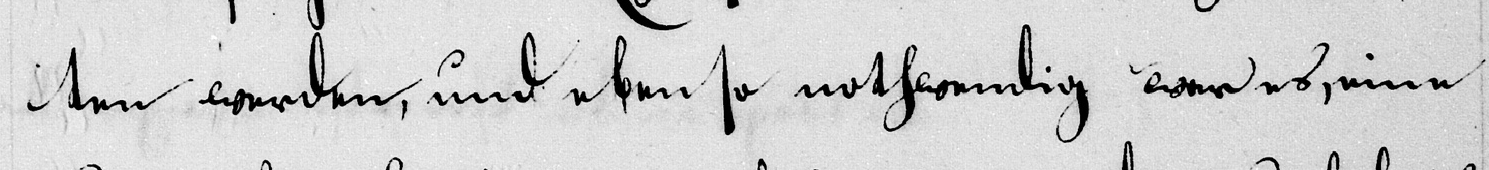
ten werden, und ebenso nothwendig war es, eine
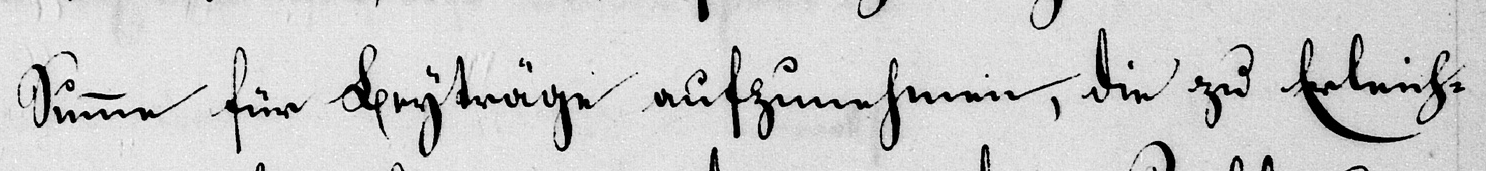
Summe für Beyträge aufzunehmen, die zu Erleich¬
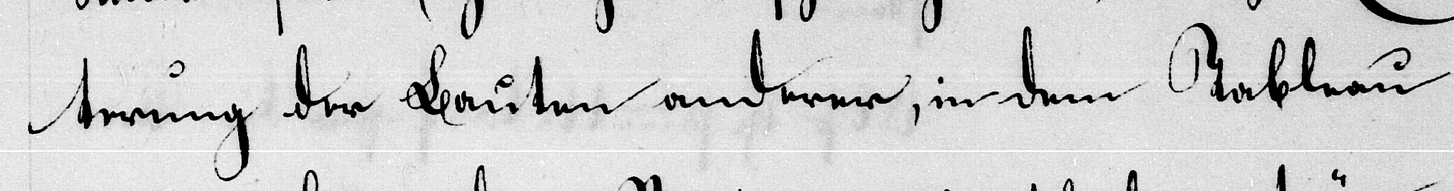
terung der Bauten anderer, in dem Tableau
